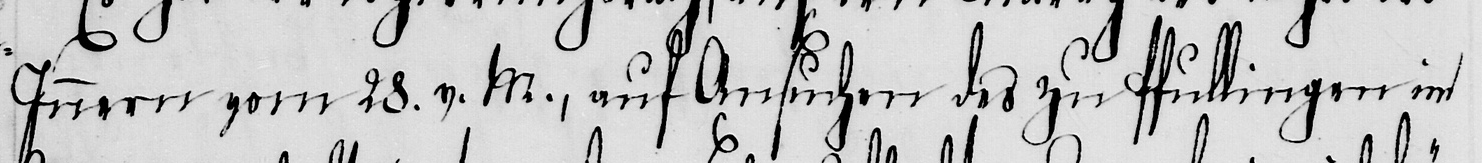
Innern vom 28. v. M., auf Ansuchen des zu Pfullingen im
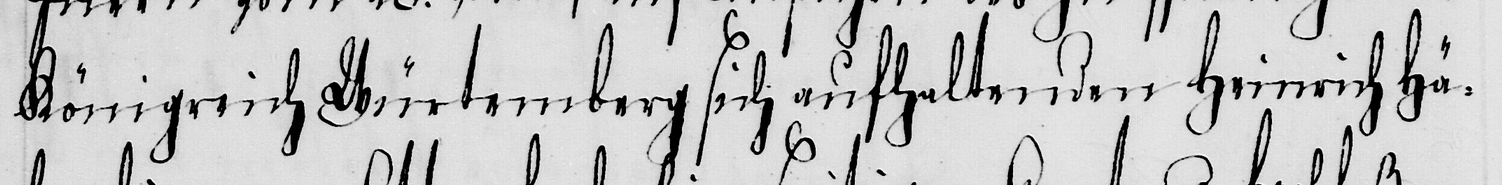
Königreich Würtemberg sich aufhaltenden Heinrich Hä¬
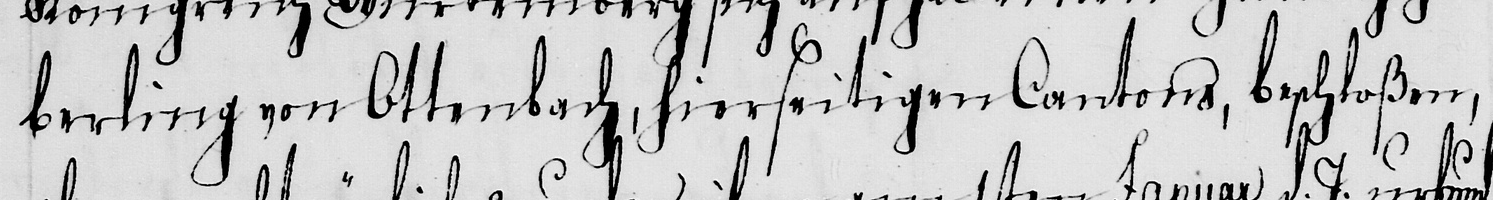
berling von Ottenbach, hierseitigen Cantons, beschloßen,
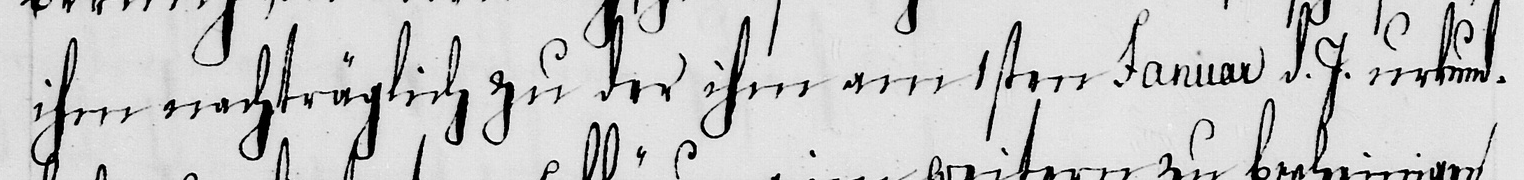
ihm nachträglich zu der ihm am 1sten Januar d. J. urkund¬
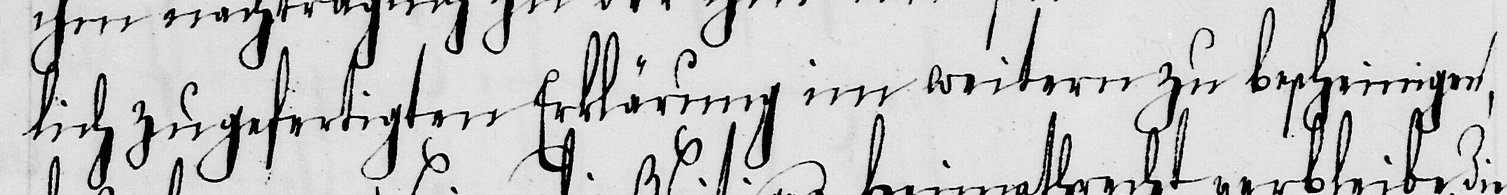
lich zugefertigten Erklärung im weitern zu bescheinigen,
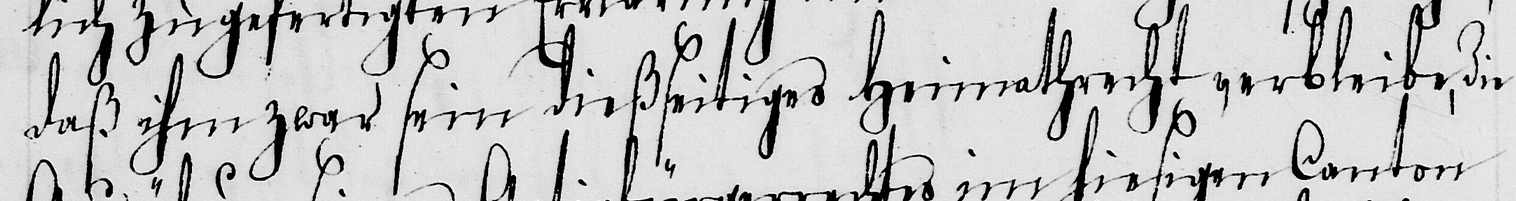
daß ihm zwar sein dießseitiges Heimathrecht verbleibe, die
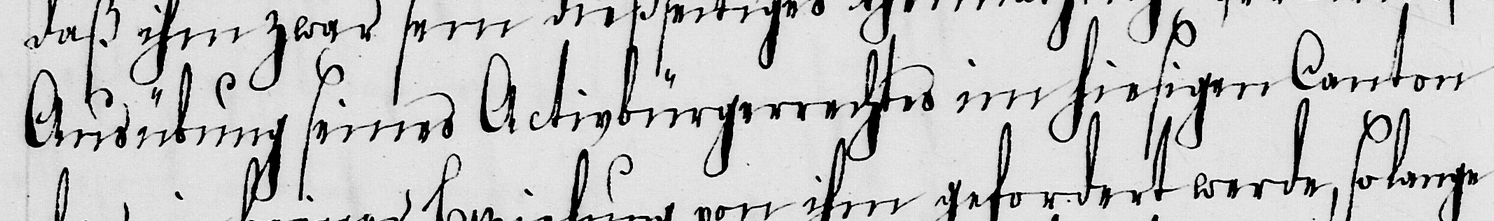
Ausübung seines Activbürgerrechtes im hiesigen Canton
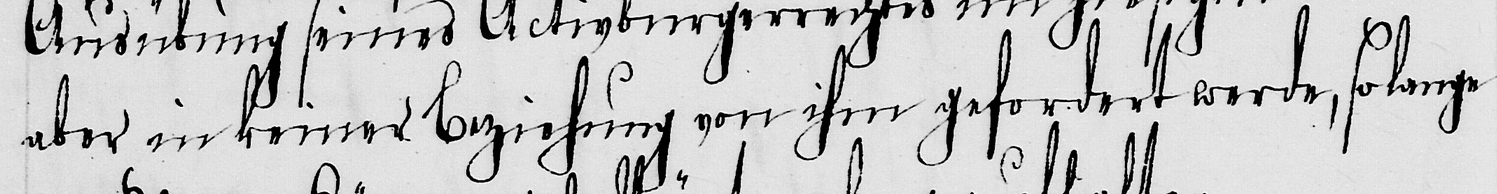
aber in keiner Beziehung von ihm gefordert werde, so lange
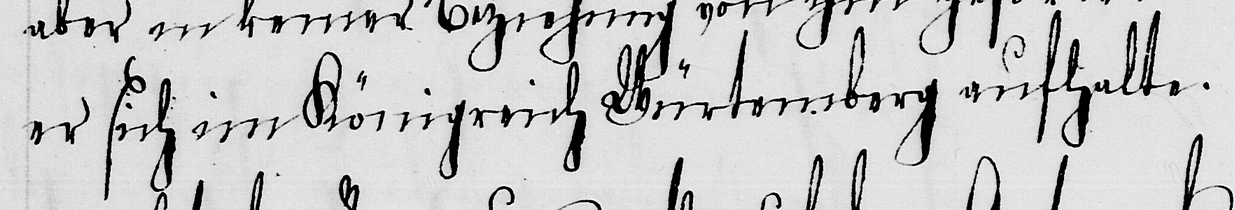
er sich im Königreich Würtemberg aufhalte.
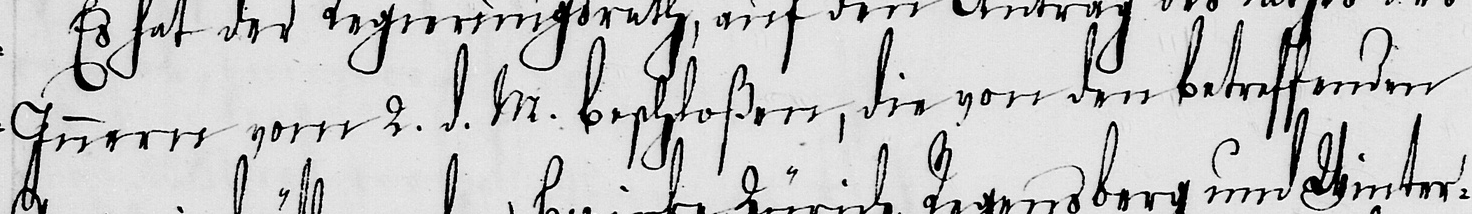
Innern vom 2. d. M. beschloßen, die von den betreffenden
